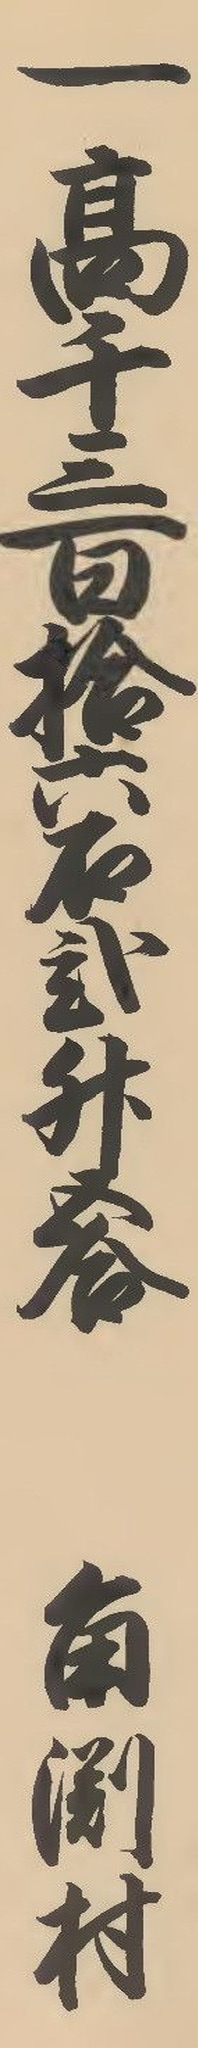一髙千三百拾六石弐升五合角渕村
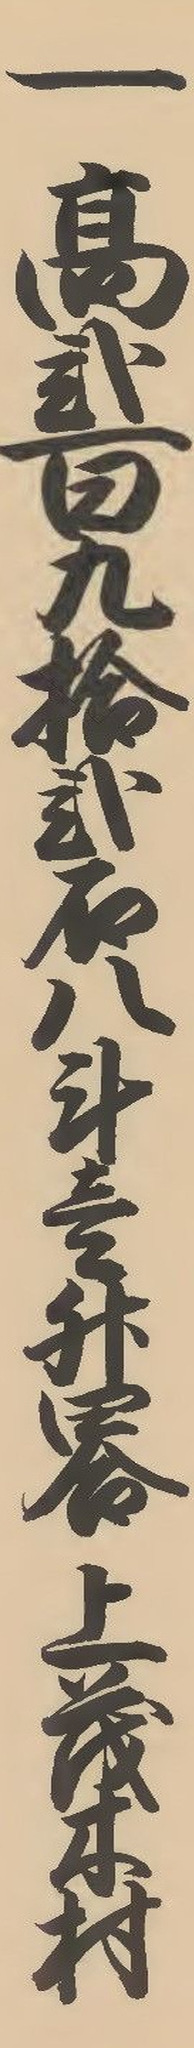一髙弐百九拾弐石八斗壱升四合上茂木村
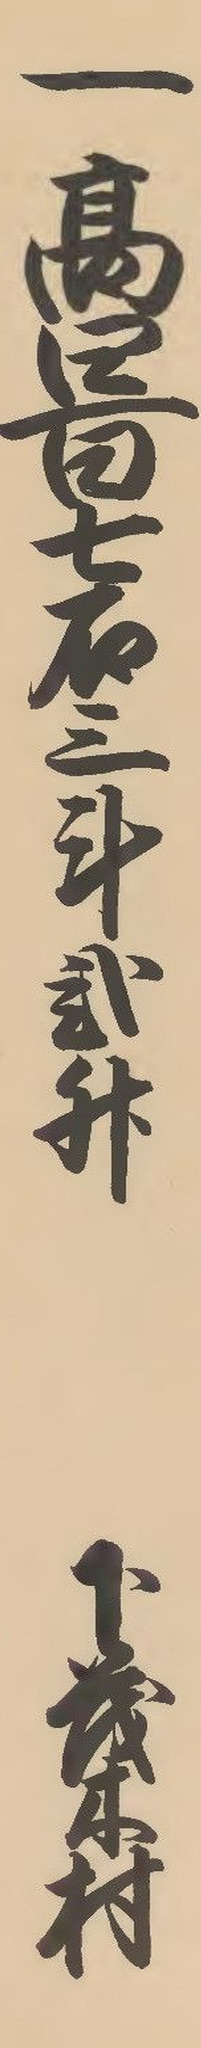一髙四百七石三斗弐升下茂木村

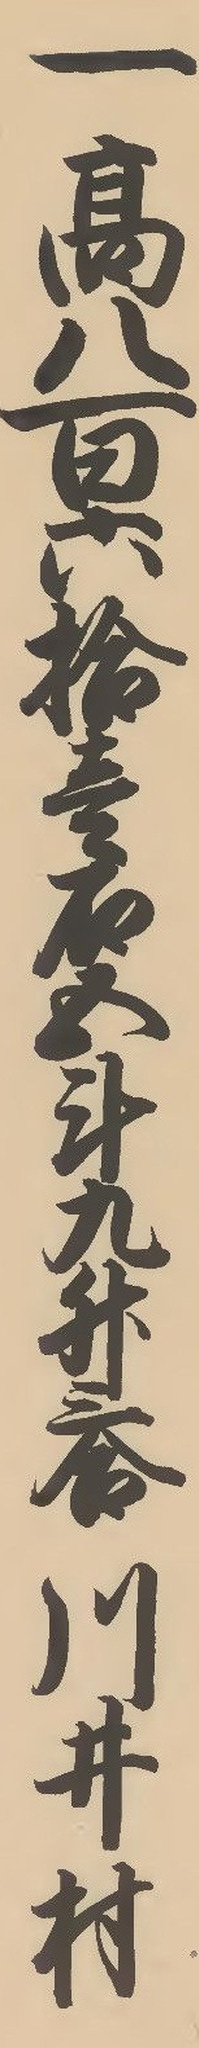一髙八百六拾壱石五斗九升三合川井村
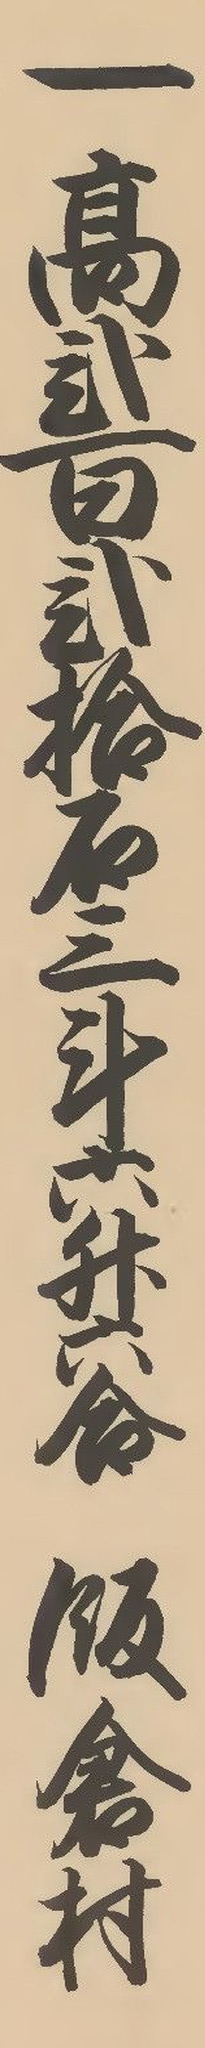一髙弐百弐拾石三斗六升六合飯倉村
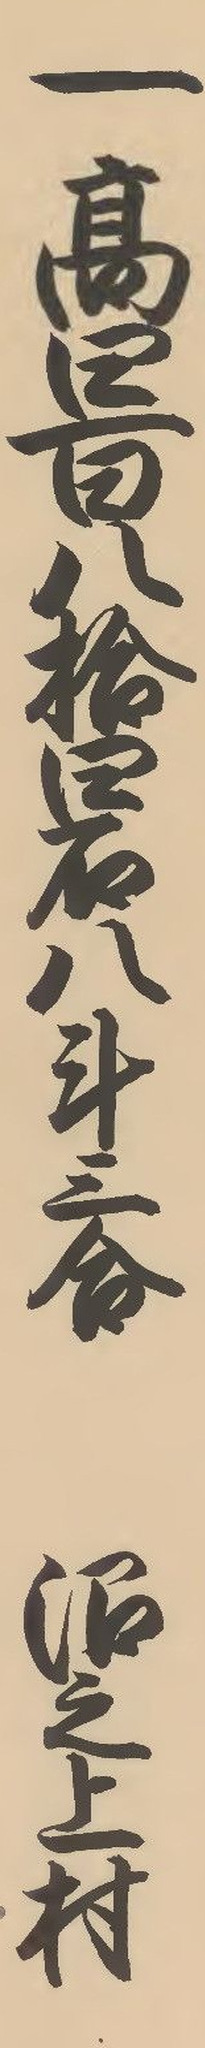一髙四百八拾四石八斗三合沼之上村
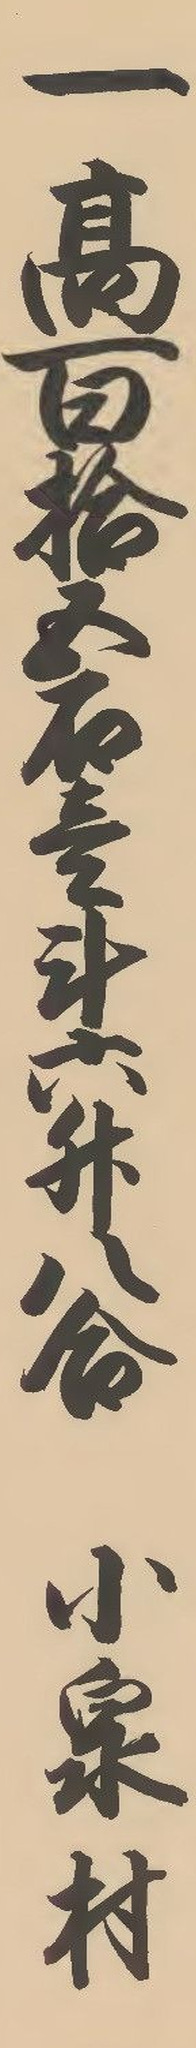一髙百拾五石壱斗六升八合小泉村
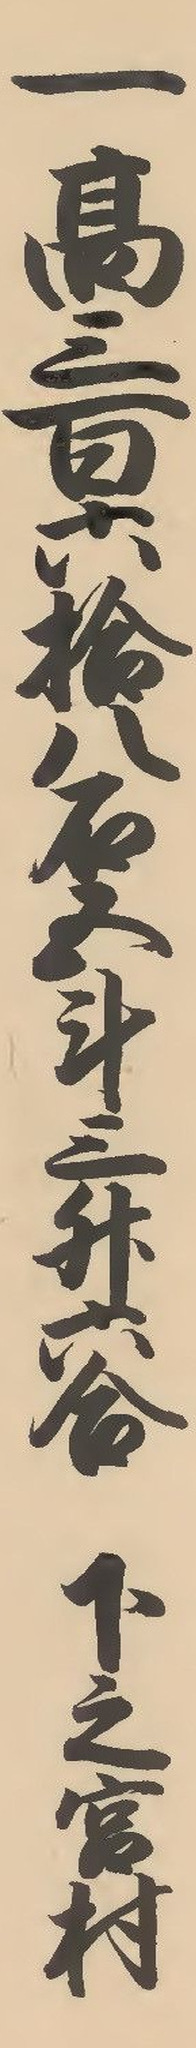一髙三百六拾八石五斗三升六合下之宮村
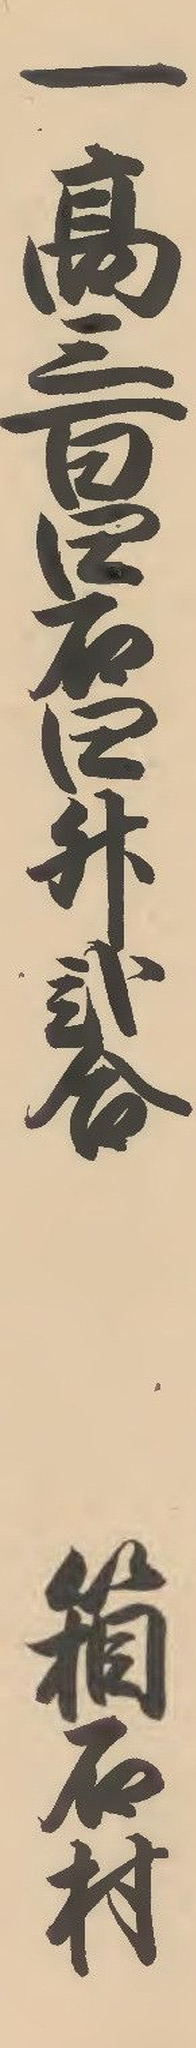一髙三百四石四斗弐合箱石村
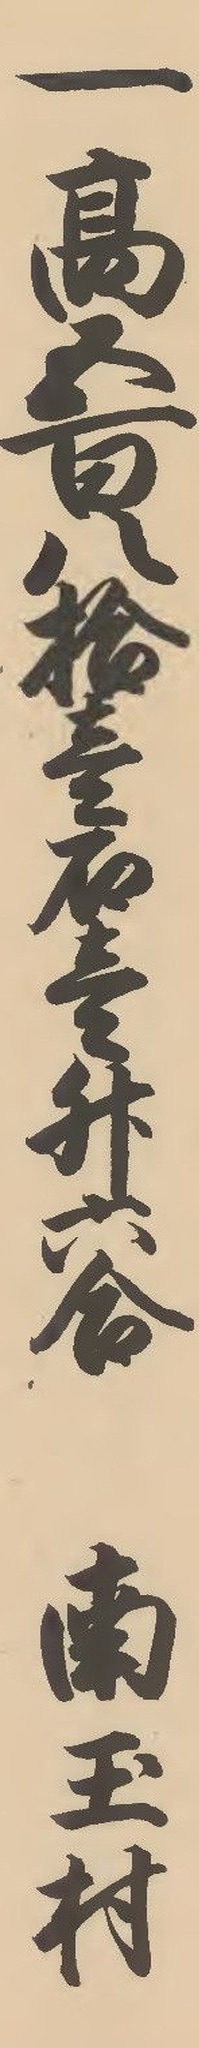一髙五百八拾壱石壱升六合南玉村
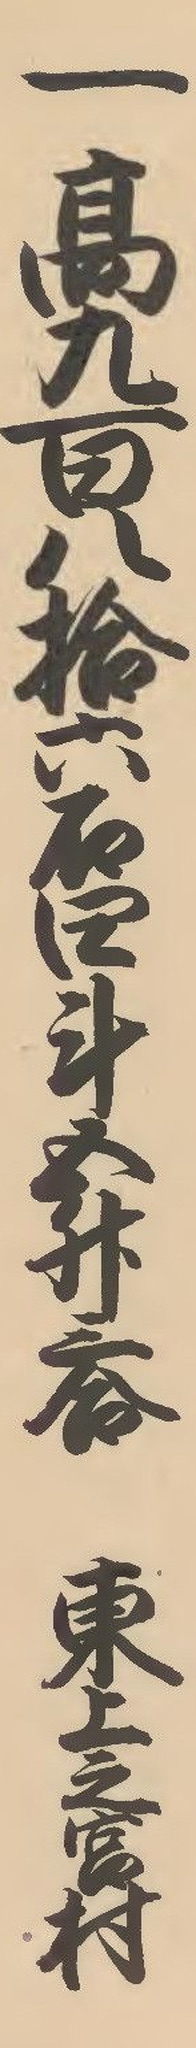一髙九百八拾六石四斗五升三合東上之宮村

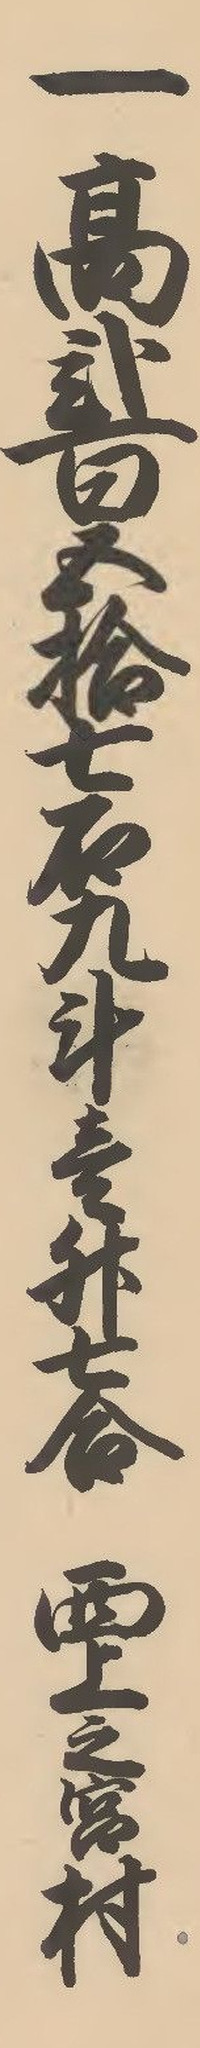一髙弐百五拾七石九斗壱升七合西上之宮村
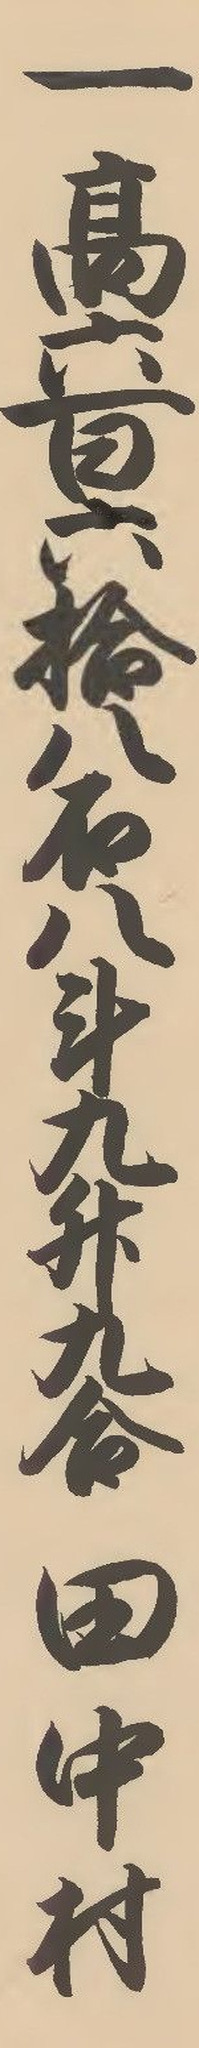一髙六百六拾八石八斗九升九合田中村
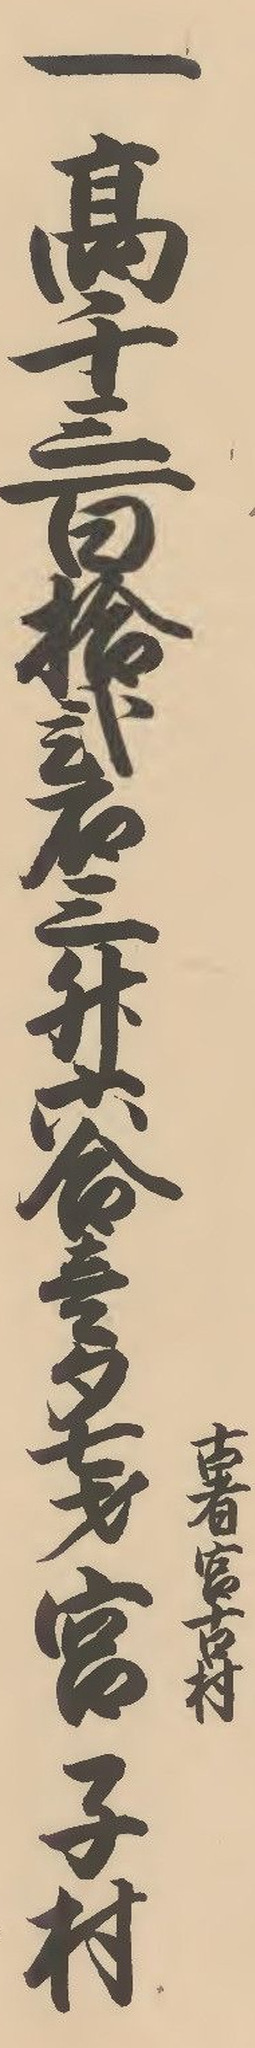一髙千三百拾弐石三升六合壱夕七才宮子村
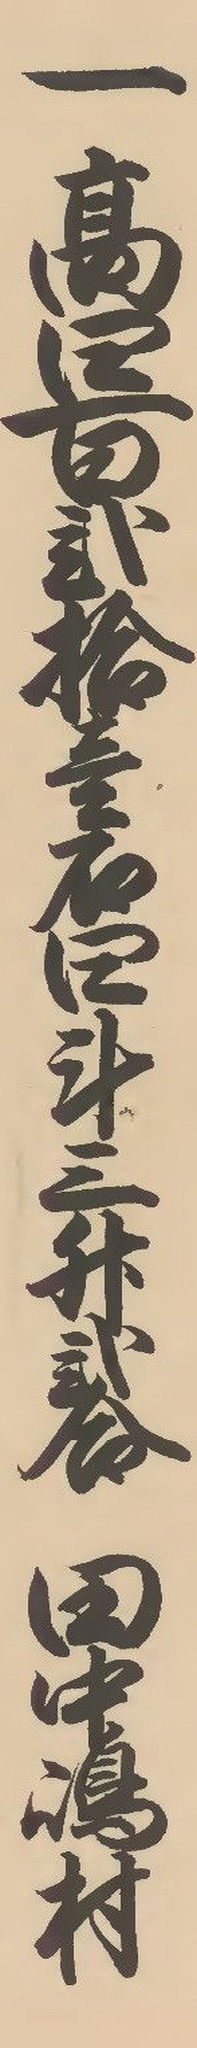一髙四百弐拾壱石四斗三升弐合田中嶋村
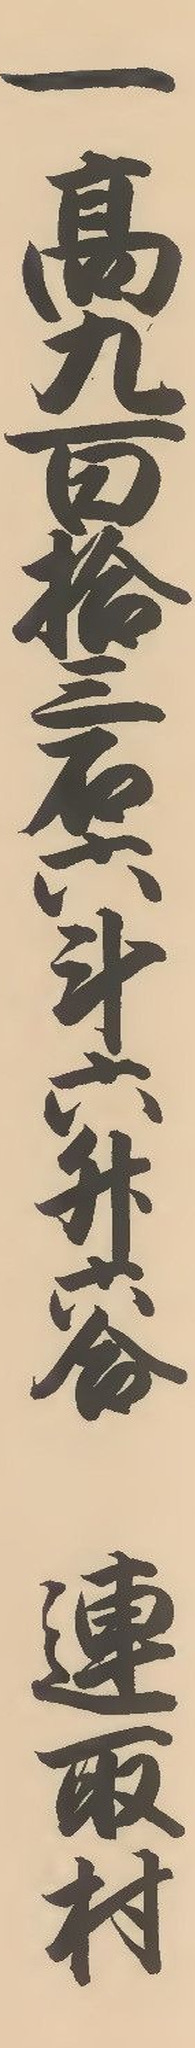一髙九百拾三石六斗六升六合連取村
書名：上野国郷帳
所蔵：国立公文書館 National Archives of Japan
